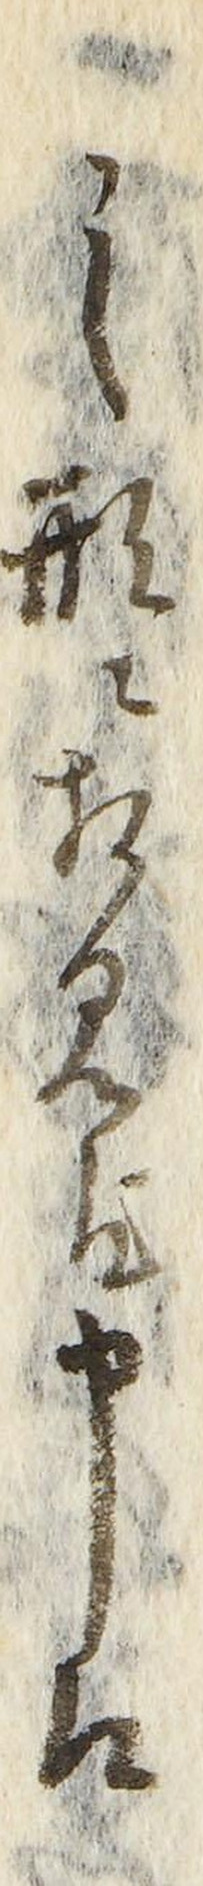之形ニ相見江申候
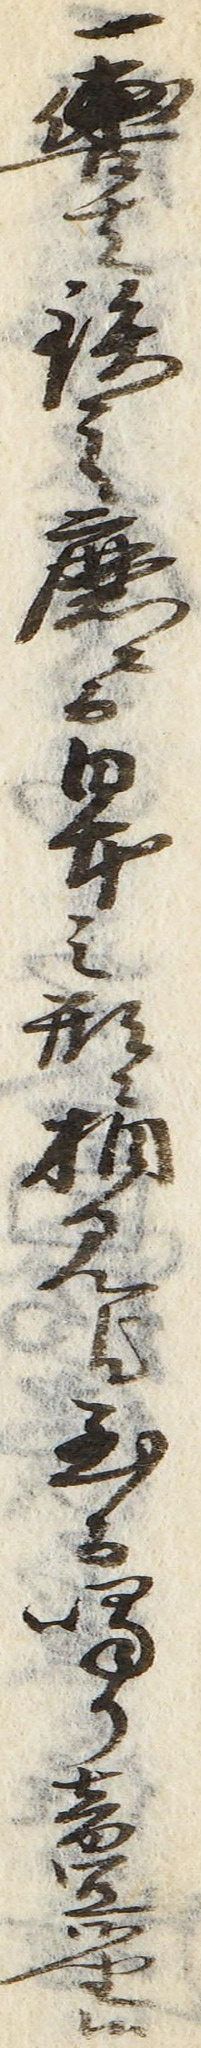一轡者鉄の磨ニ而日本之形ニ相見江至而鳴り音宜御座候
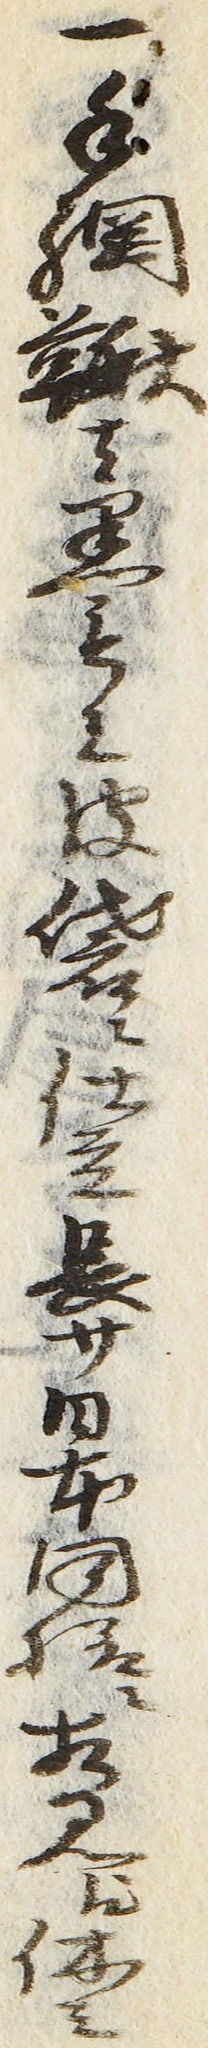一手綱鞭者黒もみ皮袋ニ仕立長サ日本同様ニ相見江休ミ
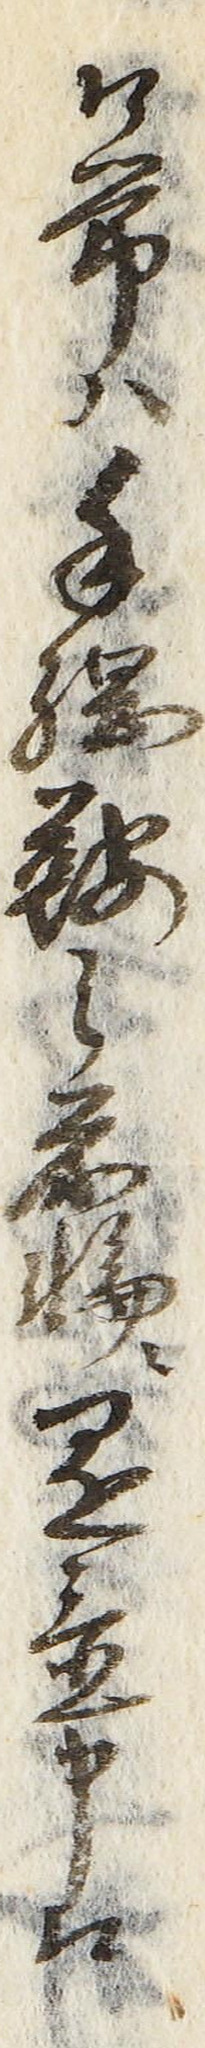候節ハ手綱鞍之前輪ニ懸置申候
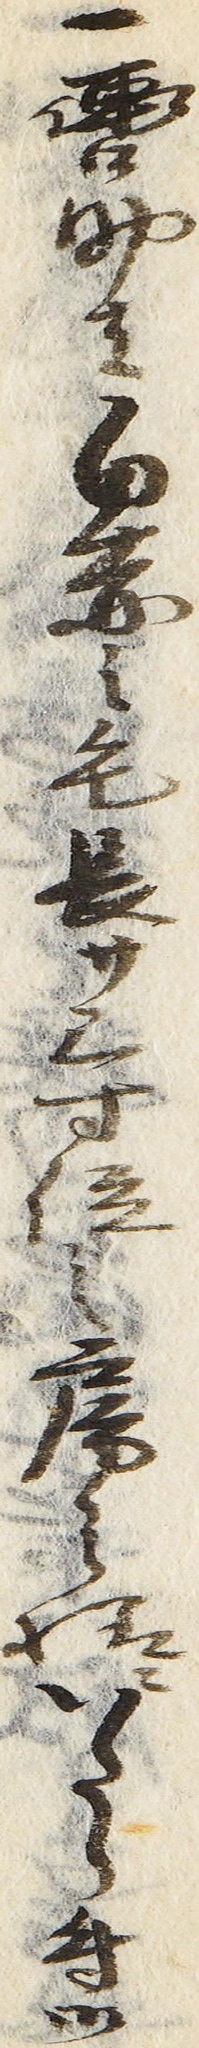一轡助者白赤之毛長サ三寸位之房之様ニいたし付御
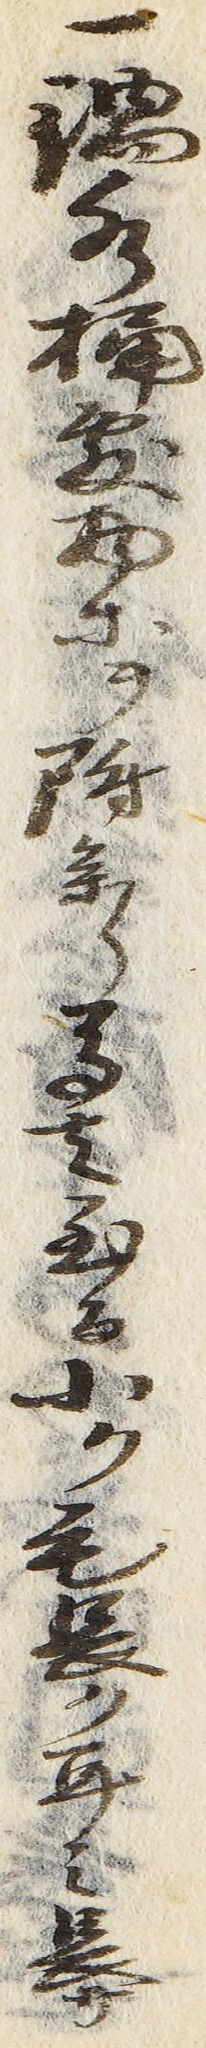一鍋水桶敷物等ヲ附参り馬者至而小ク毛長ク耳者長サ
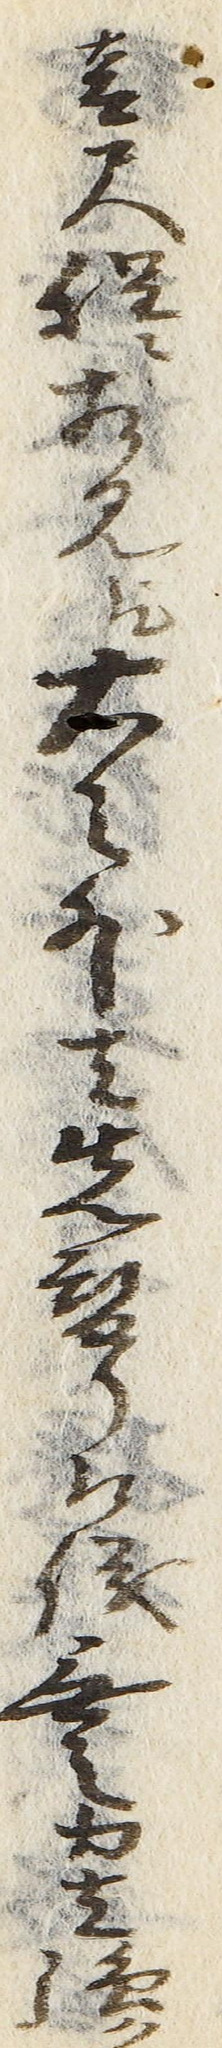壱尺程ニ相見江右之外者先替り候儀無之カ者強ク
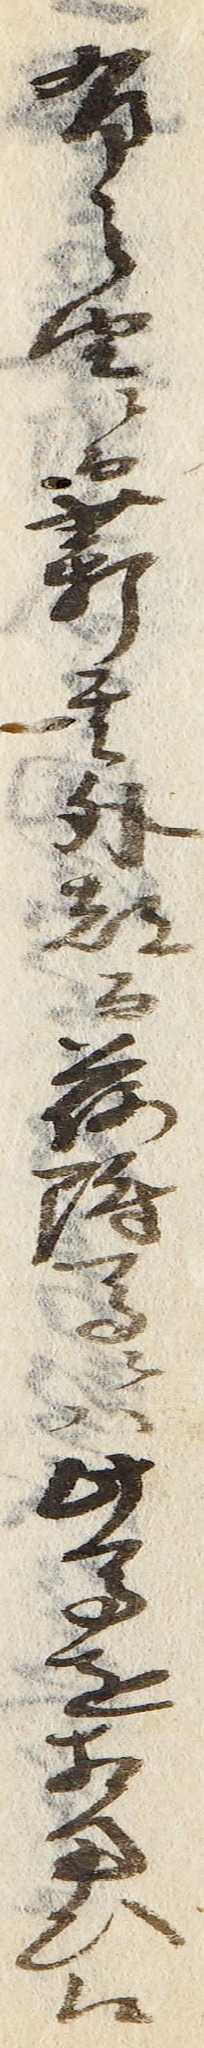有之由ニ而薪其外都而荷附馬ニハ此馬を相用ひ候
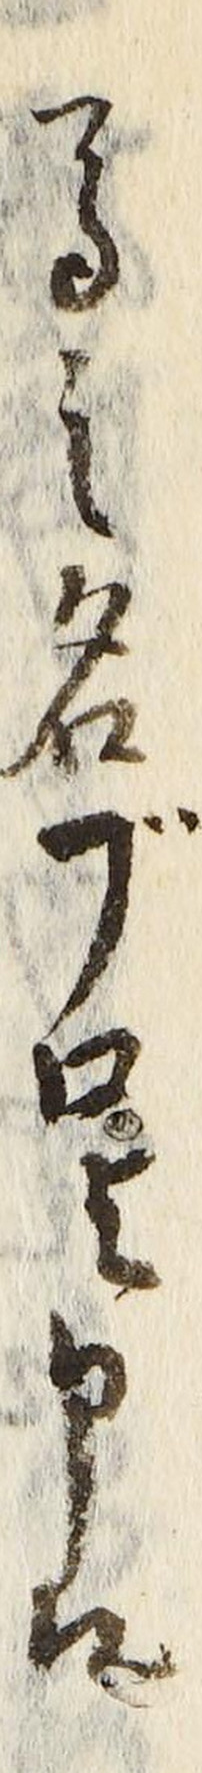馬之名ブロと申候
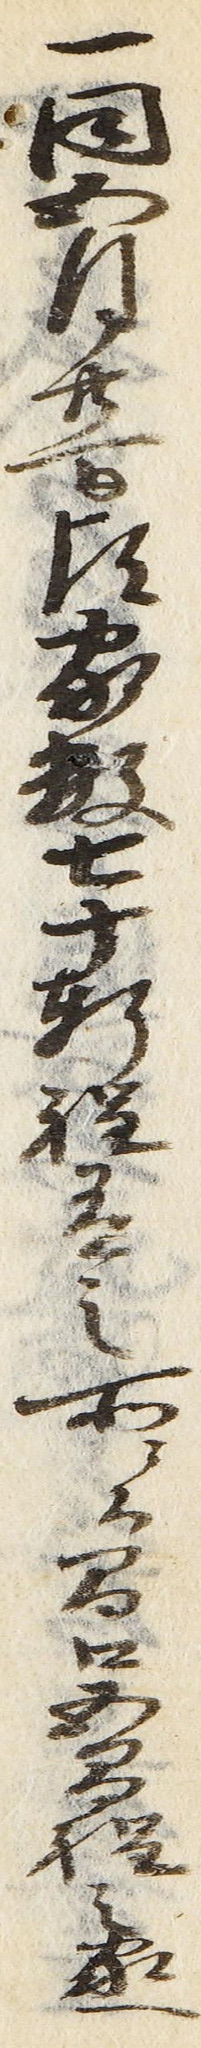一同五月廿一日頃家数七十軒程有之所ニ而間口五間程之家へ
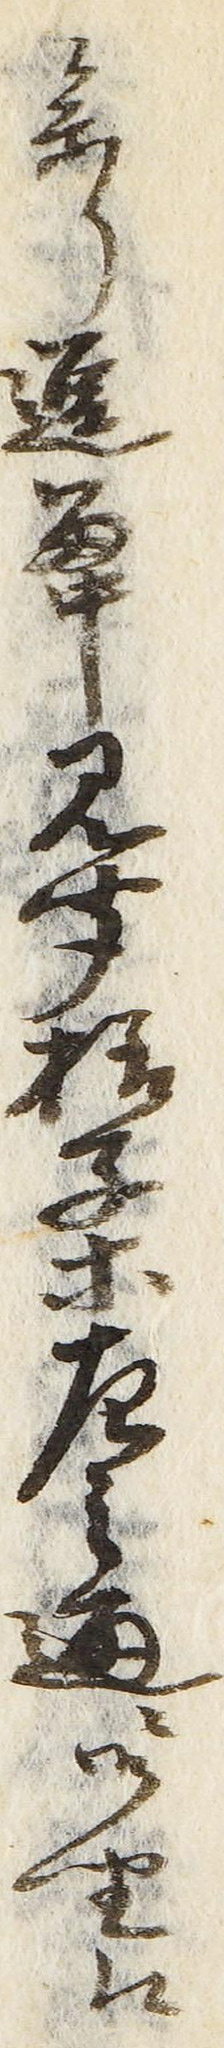参り逗留中見聞様子等左之通ニ御座候
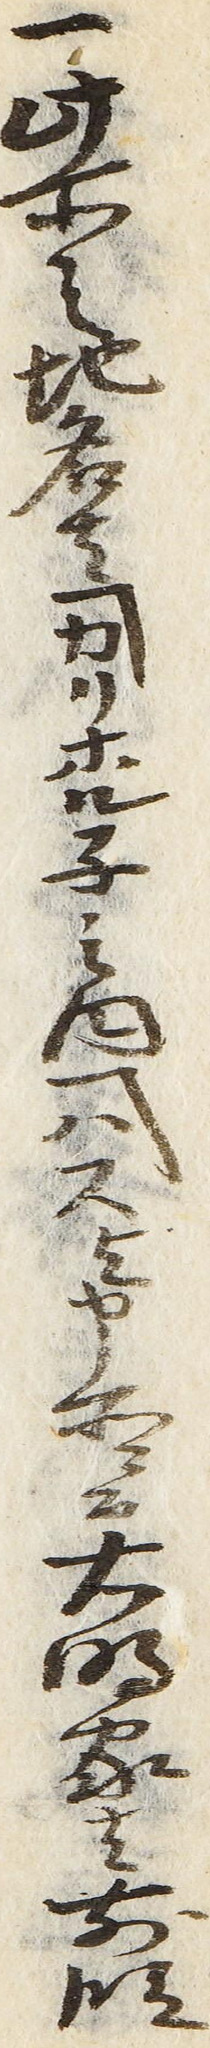一此所之地名者「カリホル子之内「ハスと申所ニ而右明家者前段
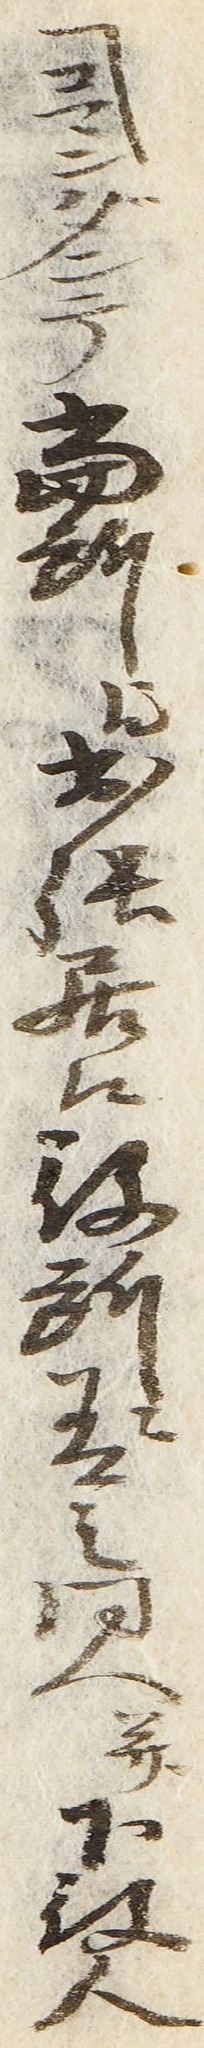「コマンダンテ當所江出張居候役所ニ有之同人幷下役人
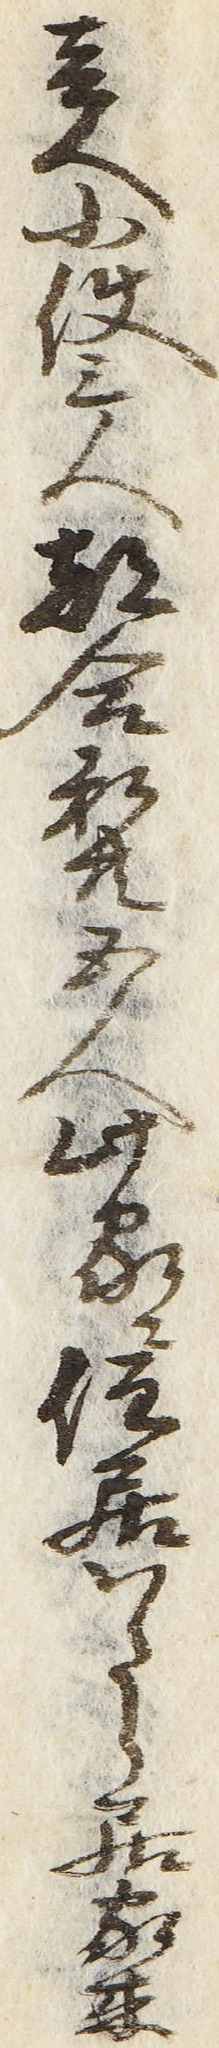壱人小使三人都合私共五人此家ニ住居いたし居家来
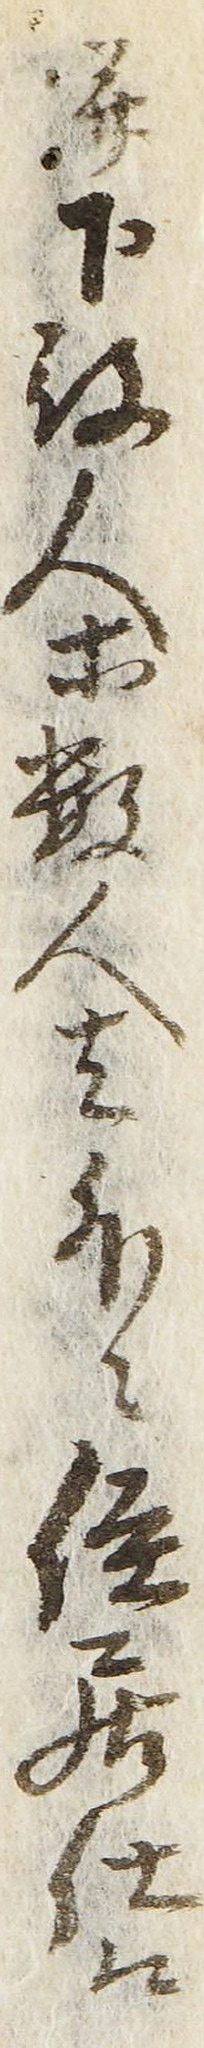幷下役人等数人者外ニ住居仕候
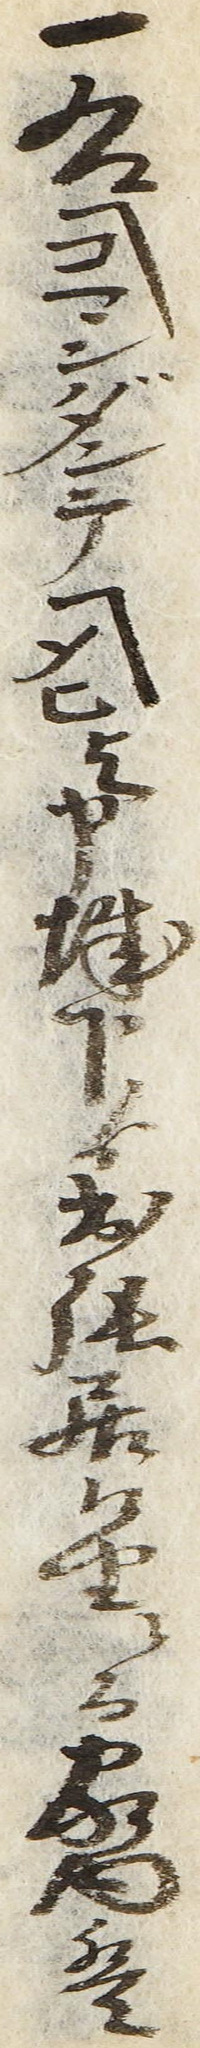一右「コマンダンテ「メヒと申城下ゟ出張居候由ニ而家内は
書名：漂流人善助聞書
